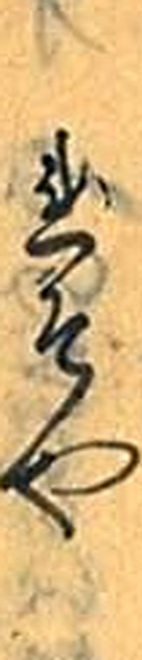れそや
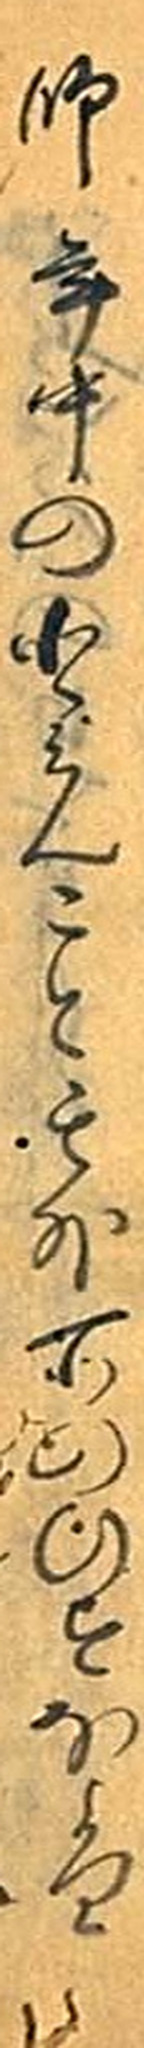師年中のとみんこと其外所のひすほより
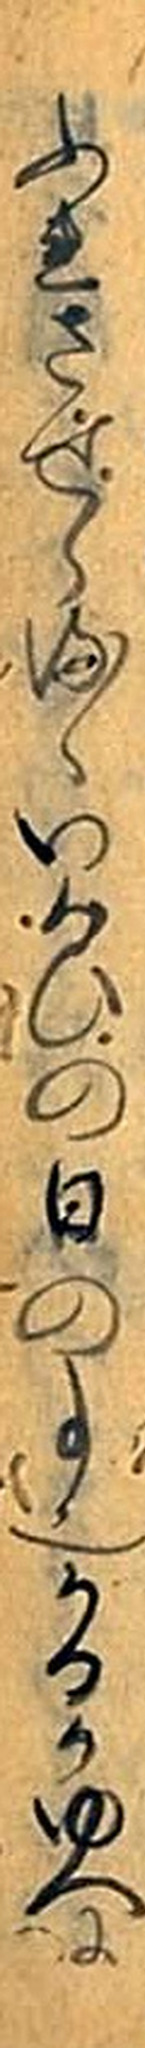ふれさせらるゝいはひの日の事也かるかゆへに

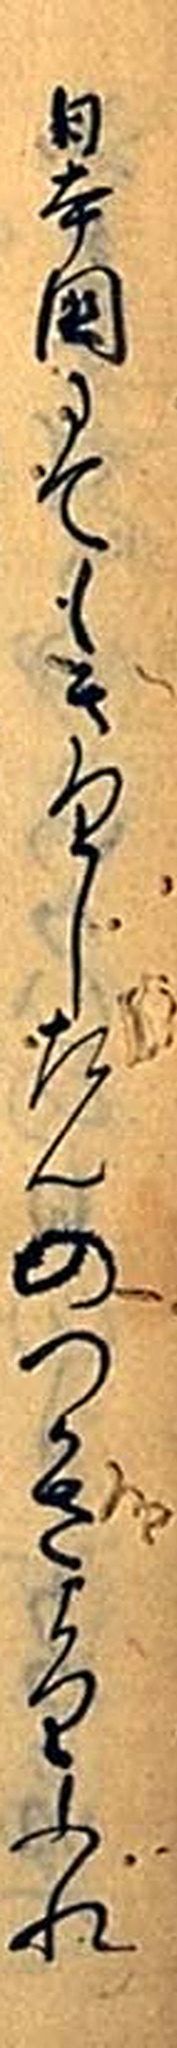日本国にてもきりしたんのつかさよりふれ
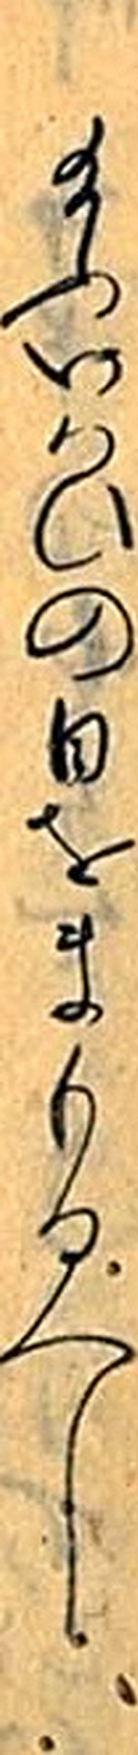給ふいはひの日をまもるへし
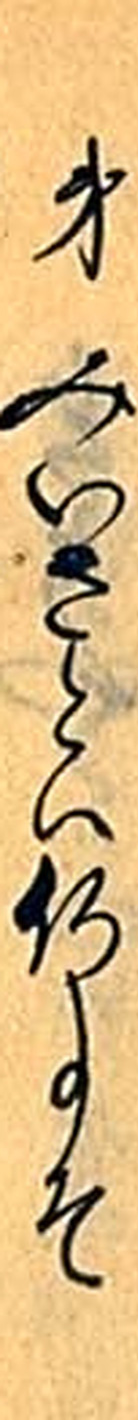弟みいさとは何事そ
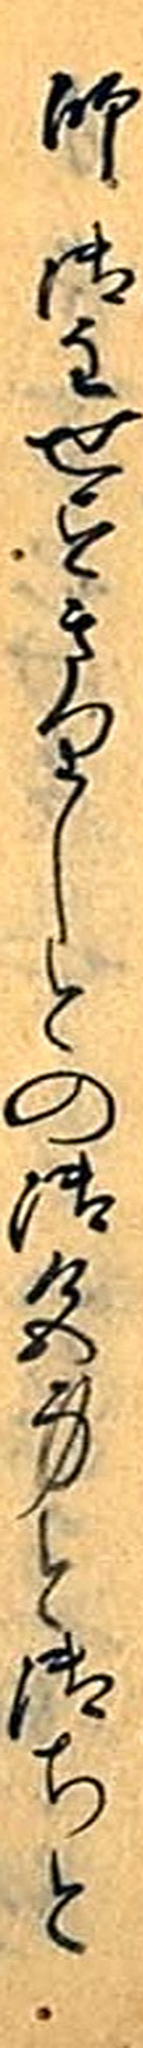師御主せすきりしとの御色身と御ちと
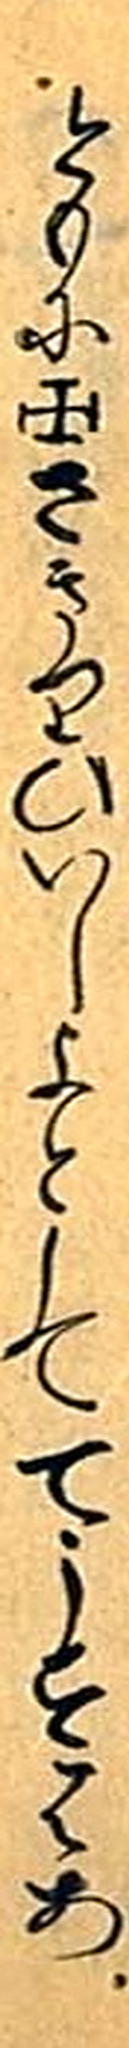ともに☩さきりひいしよとしててうすはあ
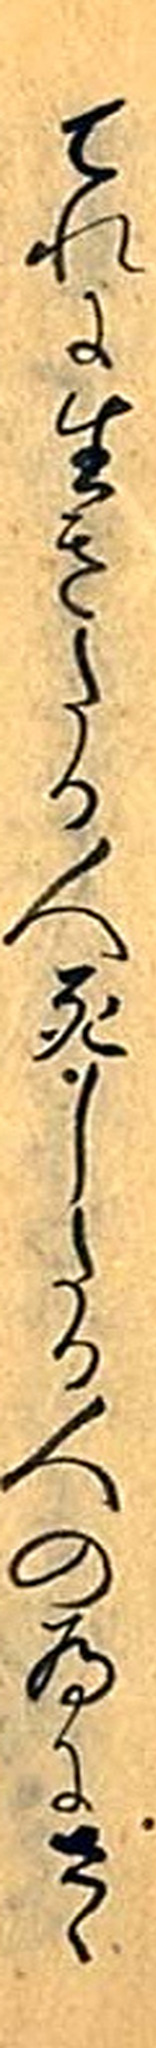てれに生きたる人死したる人の為にさゝ
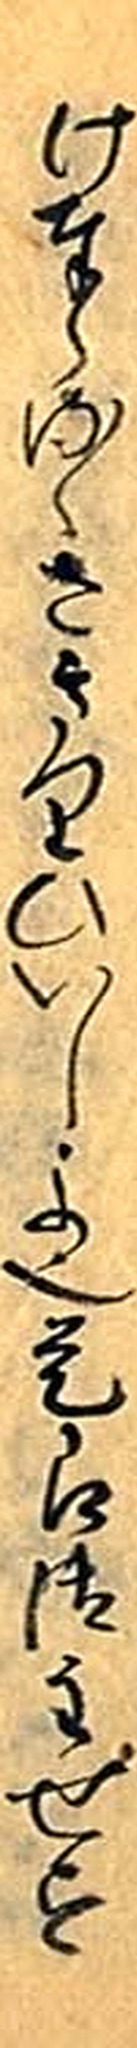け奉らるゝさきりひいしよ也是即御主せす
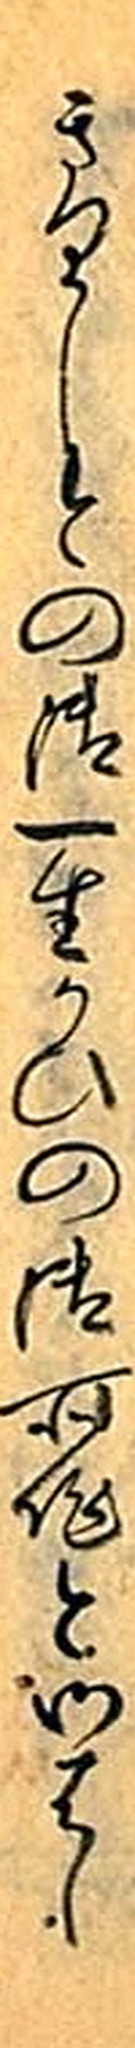きりしとの御一生かひの御所作と御はし
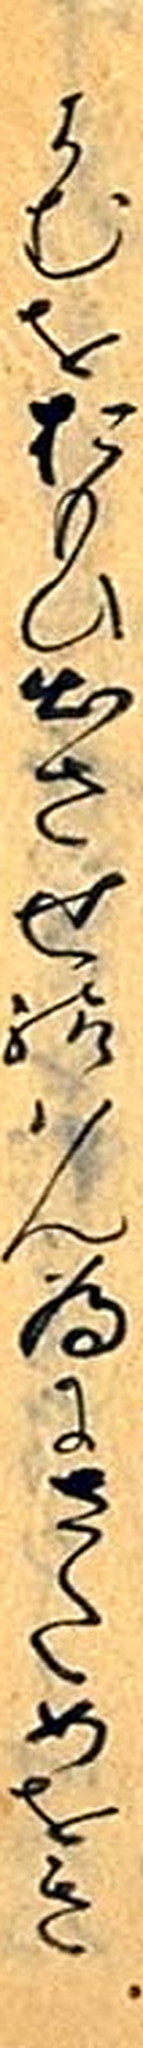よむをおもひ出させ給はん為にさためをき
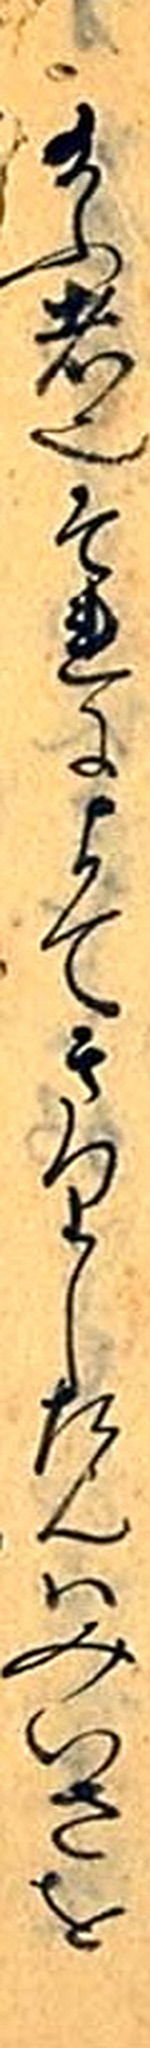給ふ者也それによてきりしたんはみいさを
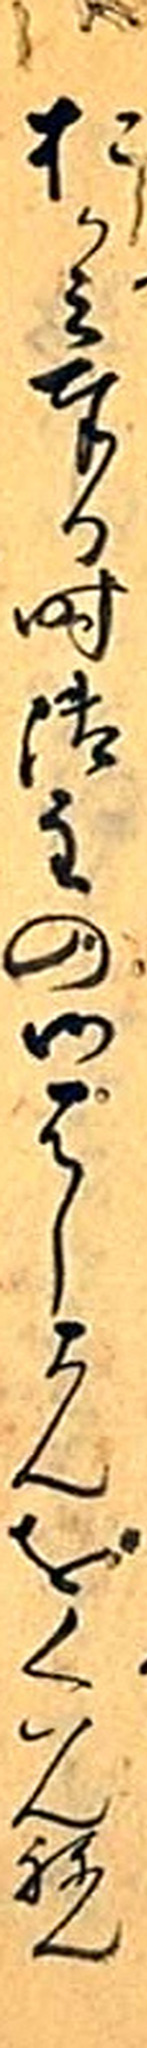おかみ奉る時御主の御はしよんをくはんねん
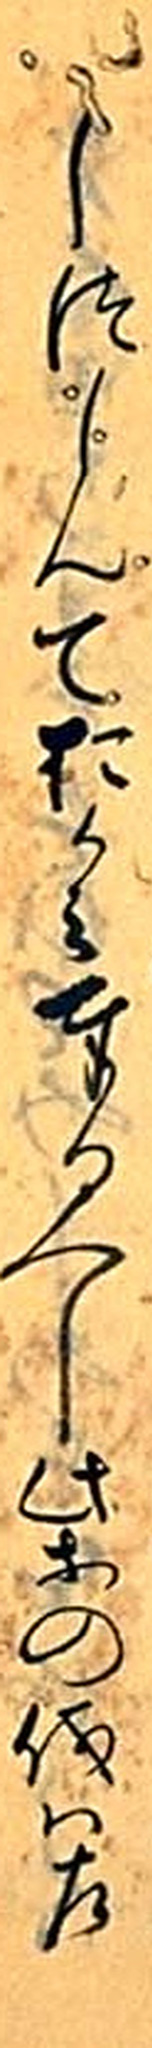しつしんておかみ奉るへし此等の儀は左
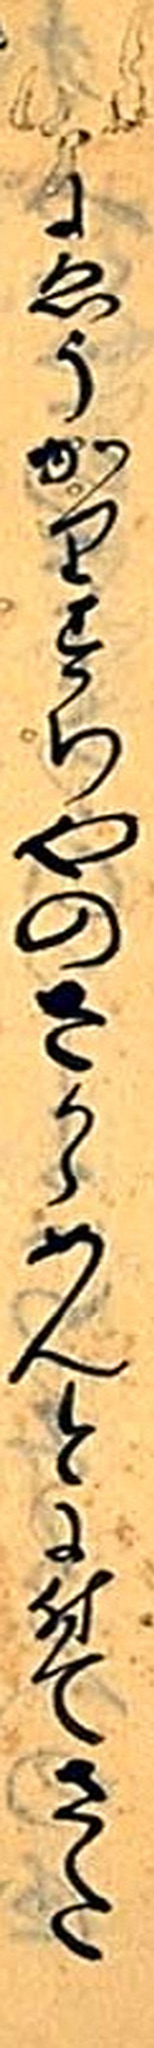にゑふかりすちやのさからめんとに付てさた
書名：ドチリナ・キリシタン
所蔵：東京大学総合図書館 / General Library in the University of Tokyo
